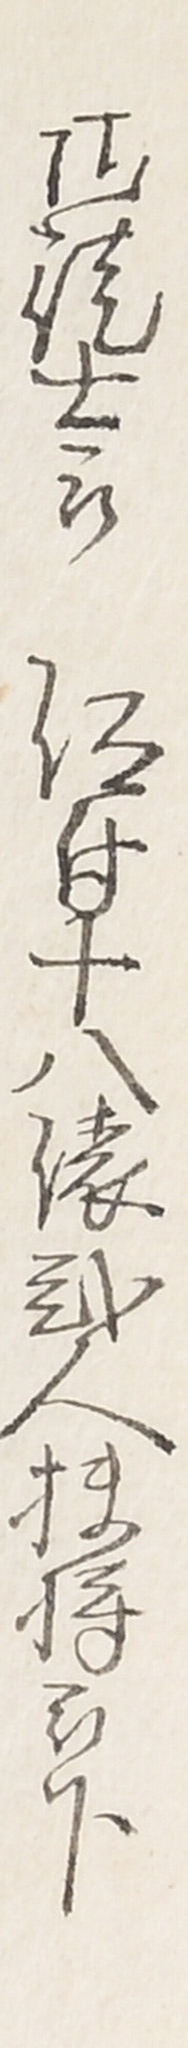御徒士被仰付十八俵弐人扶持被下
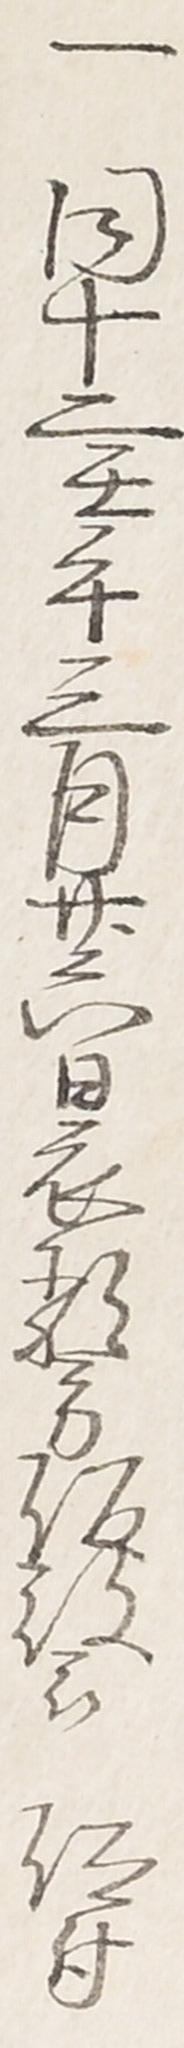一同十二壬午三月廿六日衣類方仮役被仰付
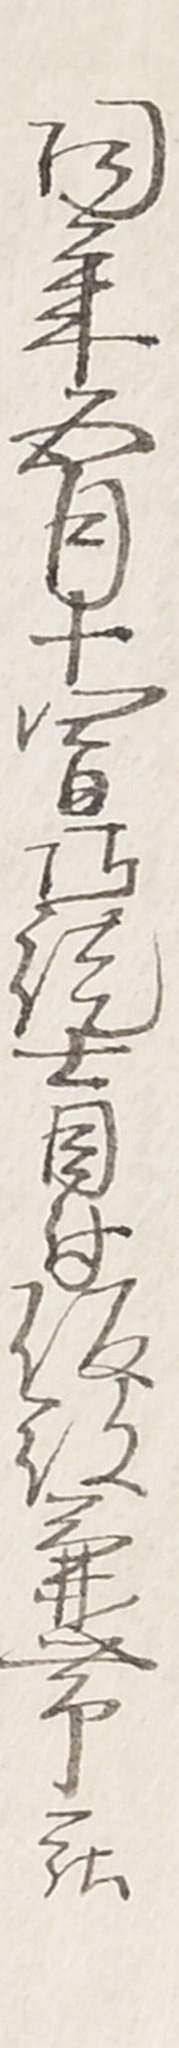一同年五月十四日御徒士目付仮役兼帯被
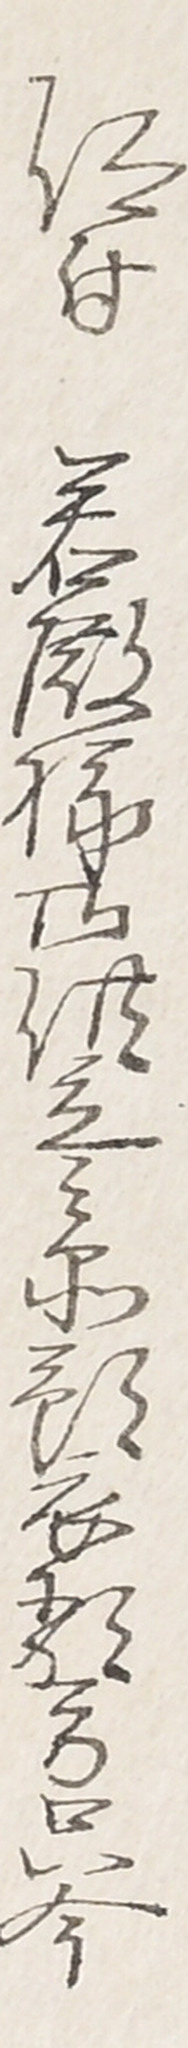仰付若殿様御供立之品預衣類方只今
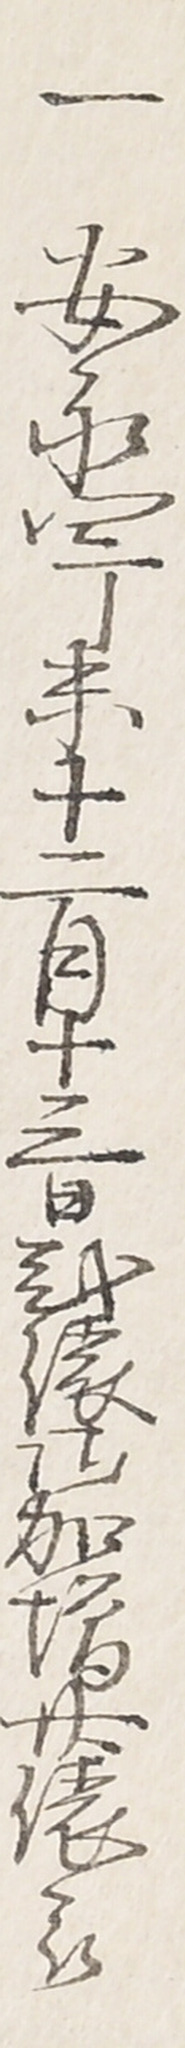一安永四丁未十二月十三日弐俵御加増廿俵被
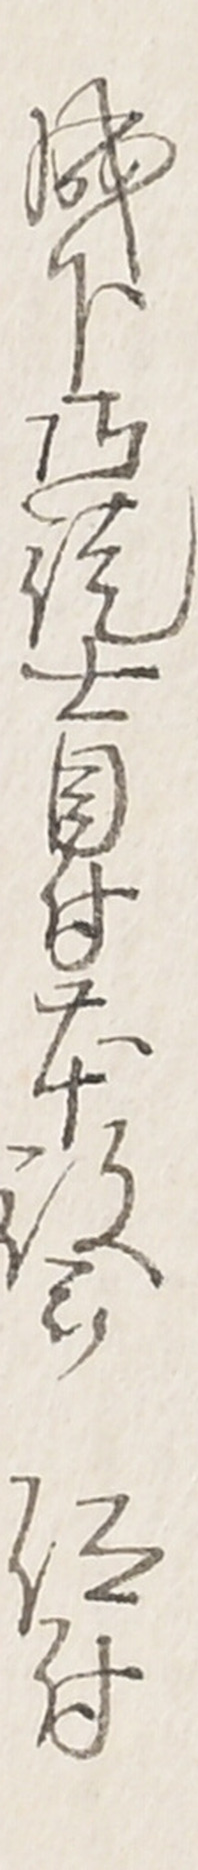成下御徒士目付本役被仰付
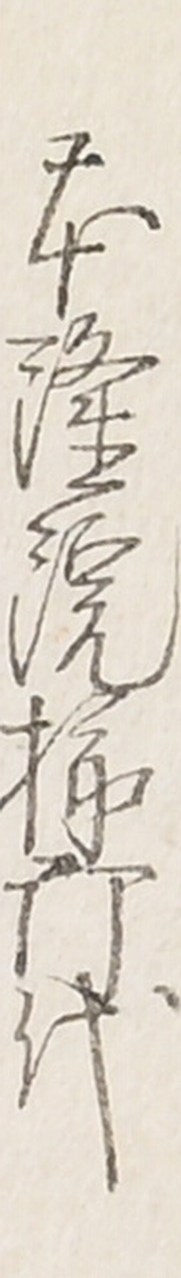本隆院様御代
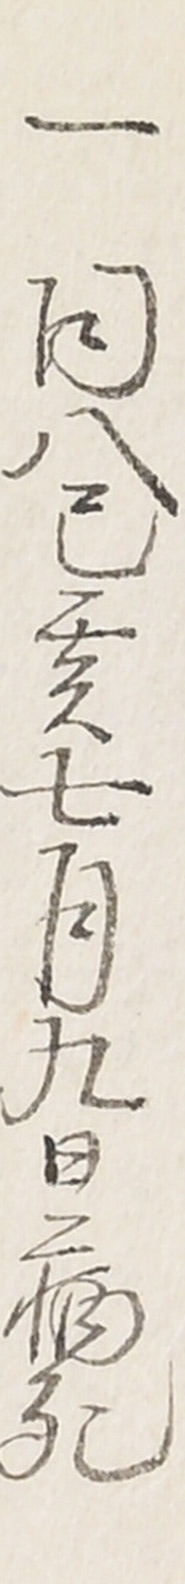一同八己亥七月九日病死
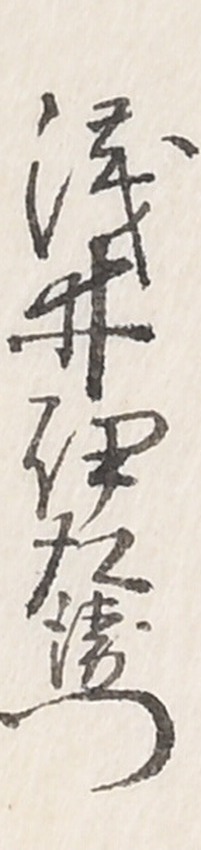浅井伊左衛門
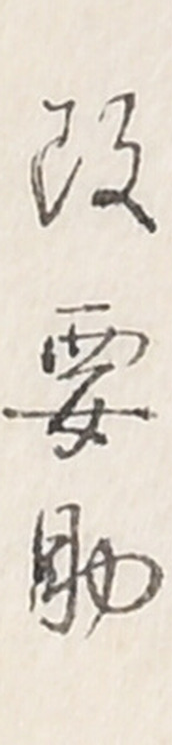改要助
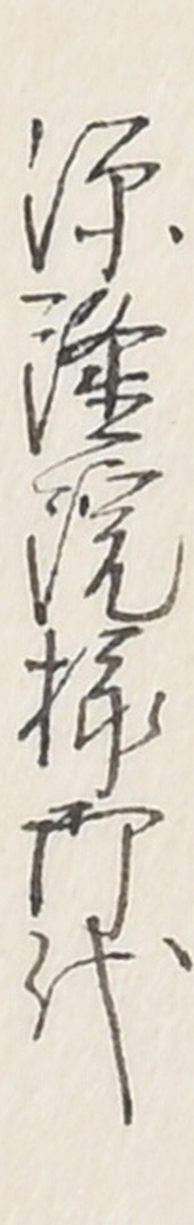本隆院様御代
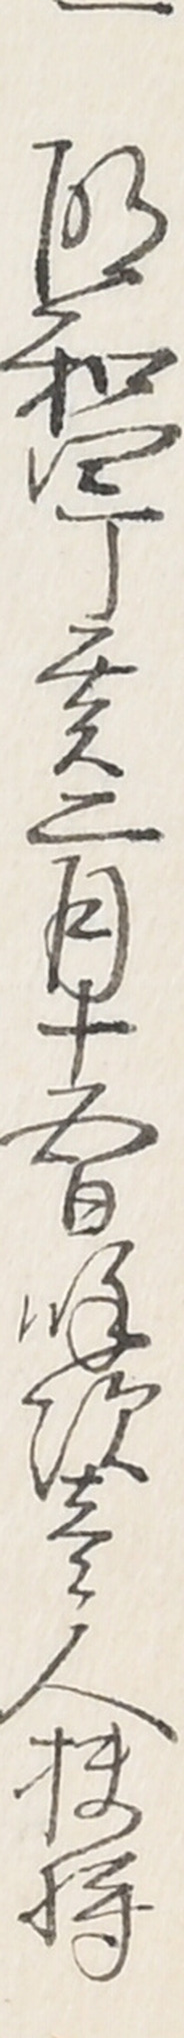一明和四丁亥二月十五日呼次壱人扶持
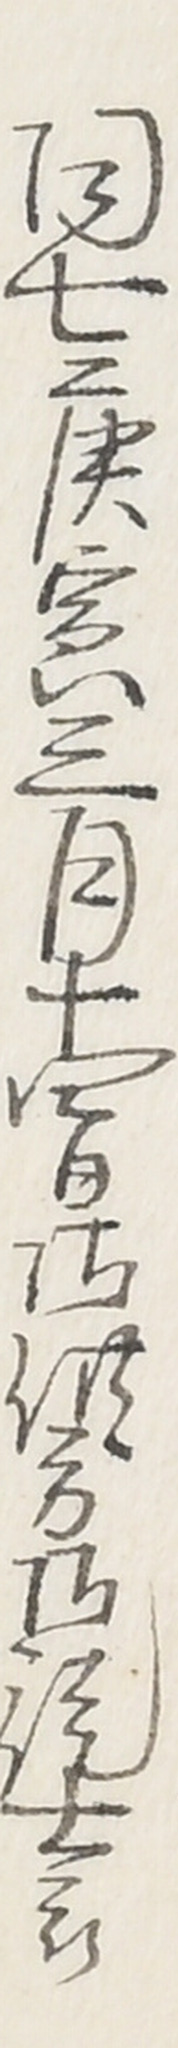一同七庚寅三月十四日御供方御徒士被
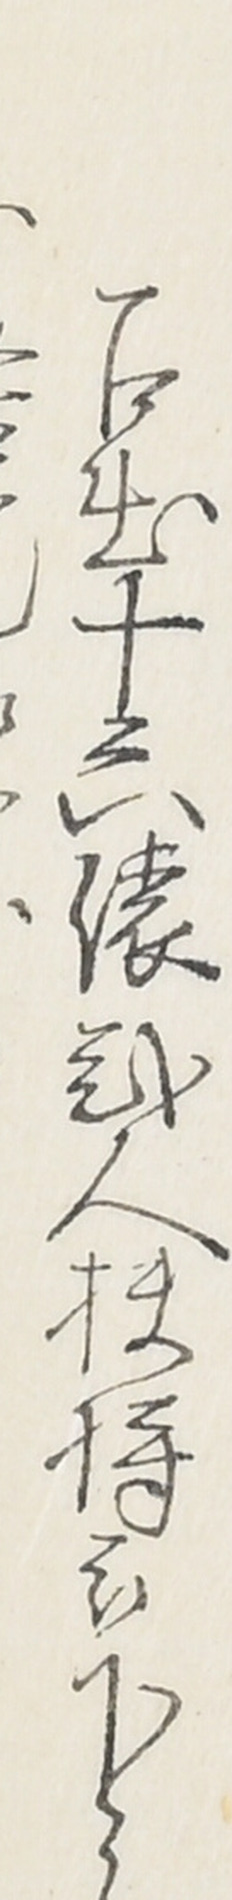召出拾六俵弐人扶持被下之
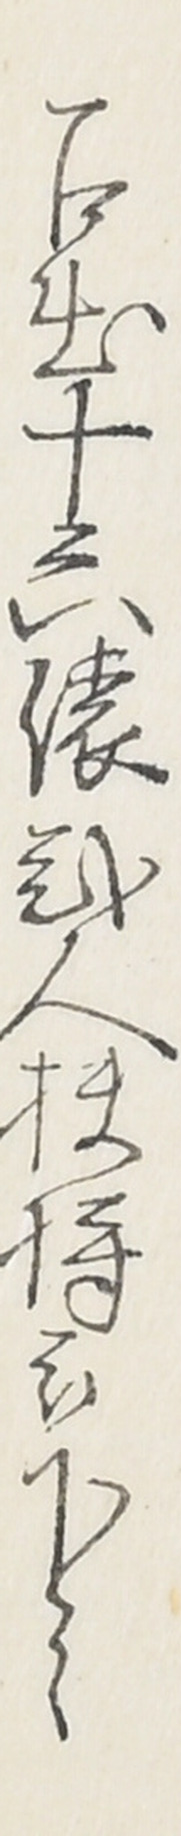召出拾六俵弐人扶持被下之
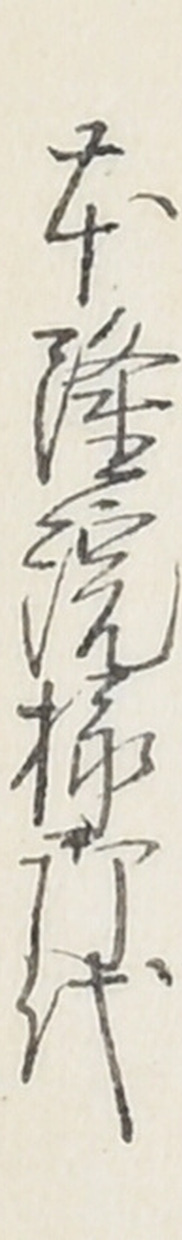本隆院様御代
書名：無足諸士勤仕録（四）
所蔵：伊那市立高遠町図書館・合同会社AMANE
